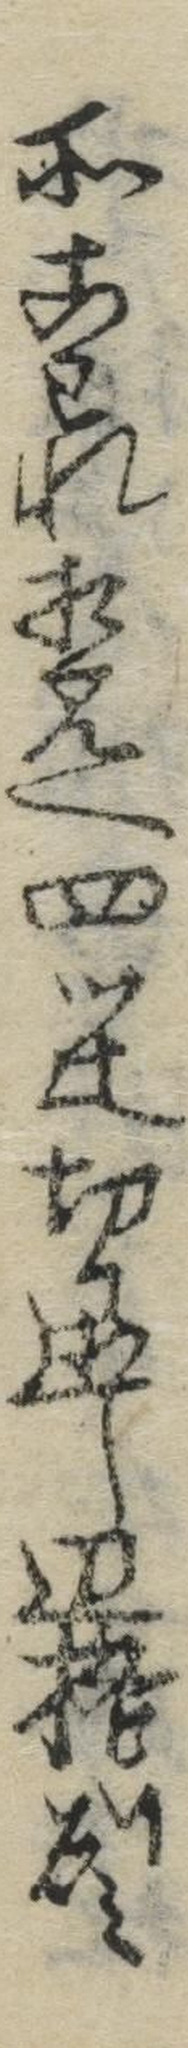所こわれ相見へ四ツ辻切通し辺格別之
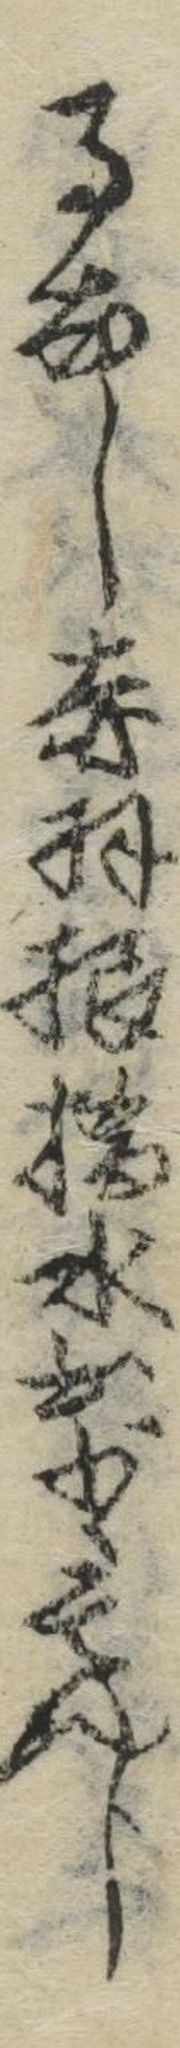事なし赤羽根橋水出少そんじ
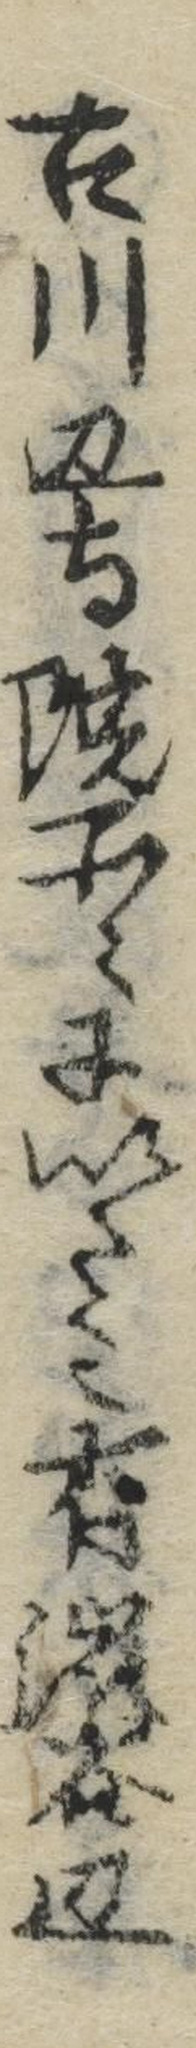古川辺寺院所〻にいたミ有渋谷辺
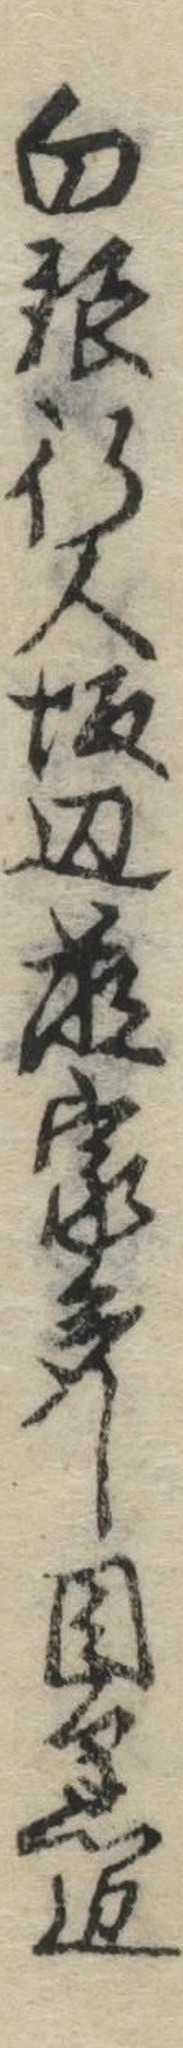白銀行人坂辺崩家多し目黒辺
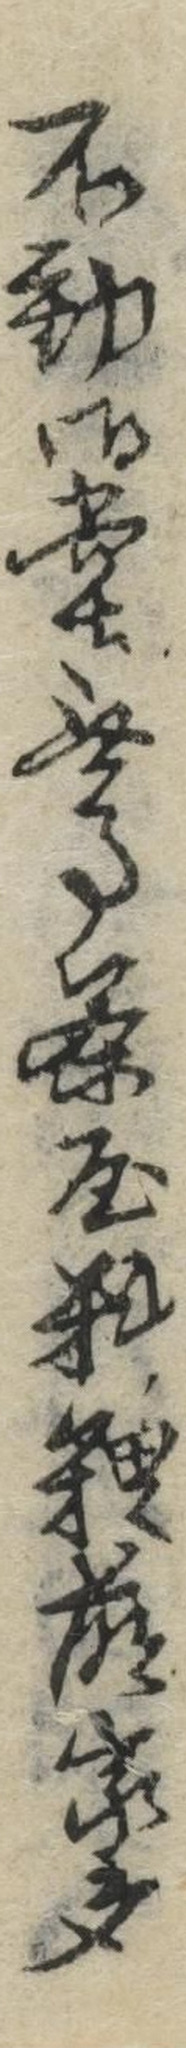不動御堂無事茶屋料裡崩家多
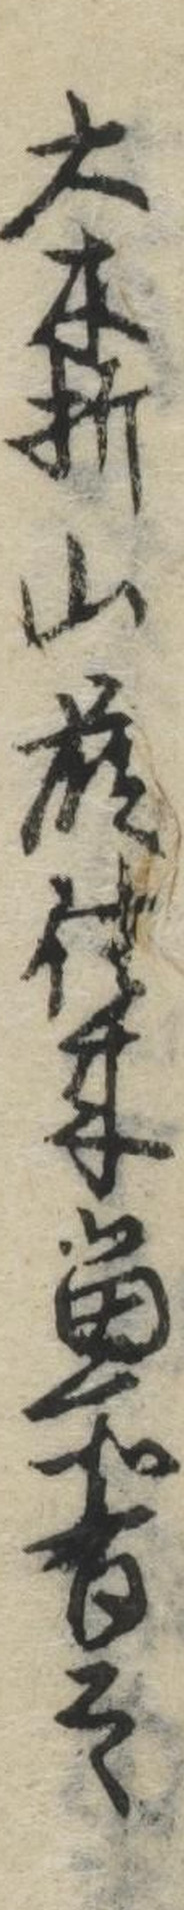大木折山崩往来留所有之
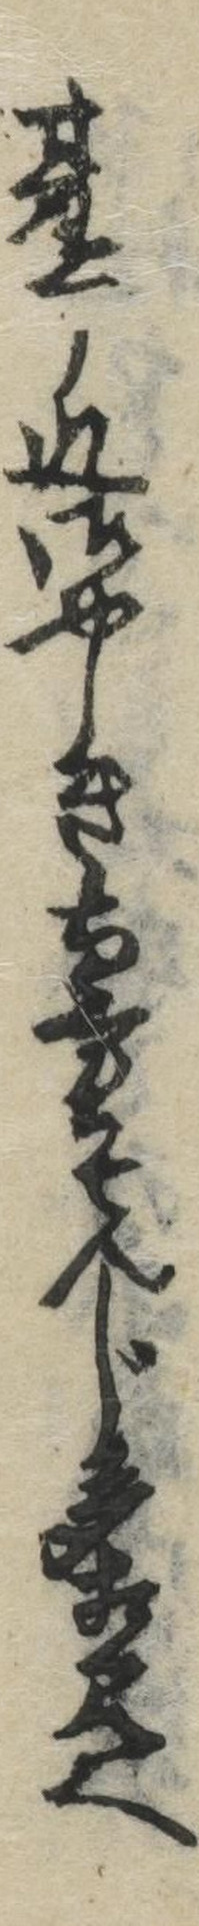臺ノ近御やしき両方そんじ多相見へ
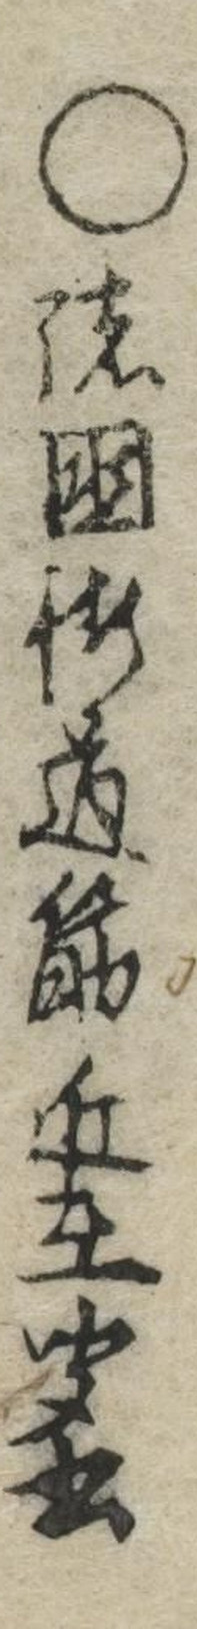〇諸国街道筋近在聞書
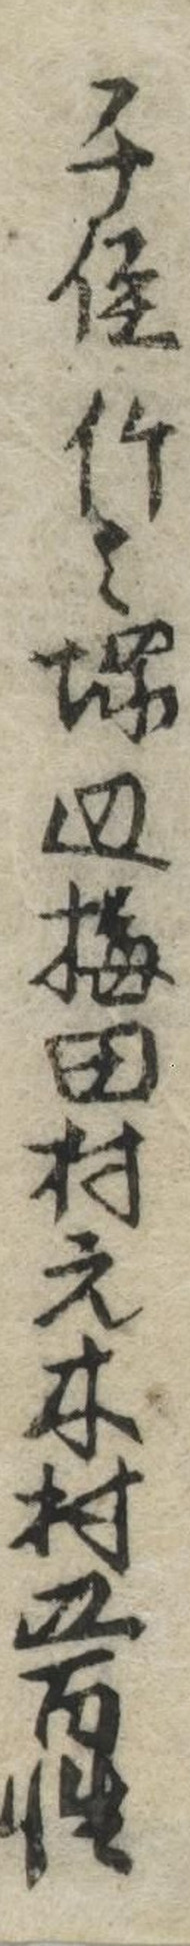千住竹之塚辺梅田村元木村辺百性
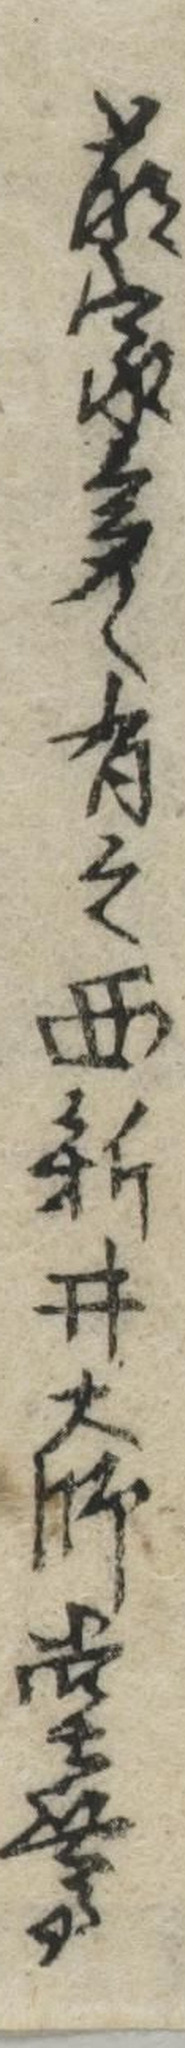崩家多く有之西新井大師堂無事
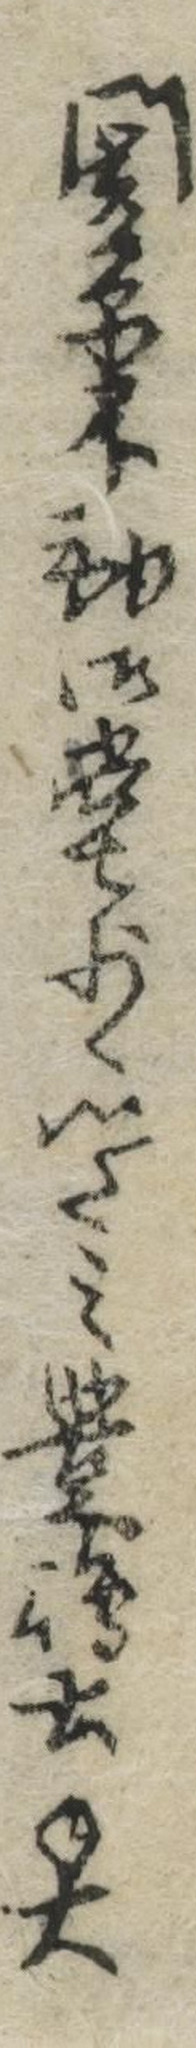関原不動御堂少〻いたミ豊嶋土手大
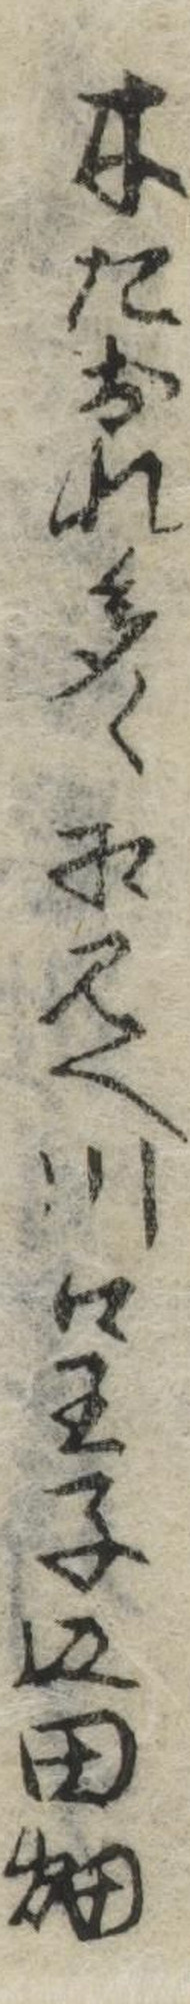木たおれ多く相見へ川口王子辺田畑
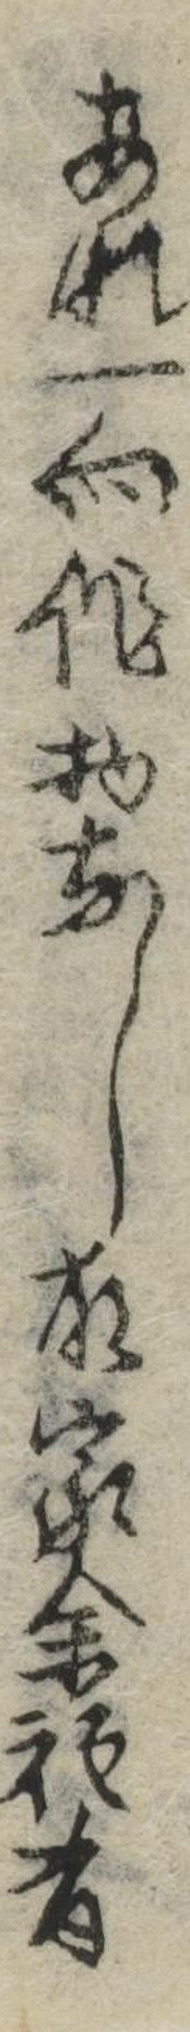あれ一向作物なし崩家余程有
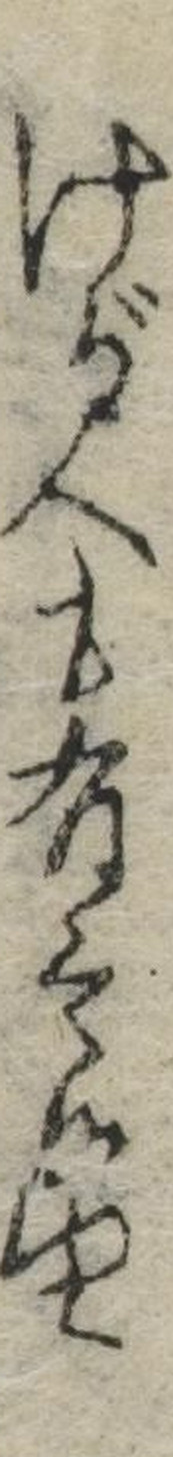けが人も有之候由

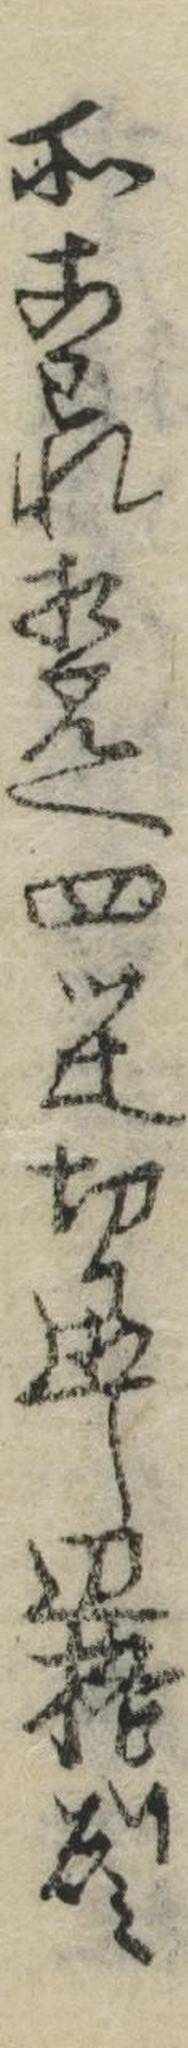所こわれ相見へ四ツ辻切通し辺格別之
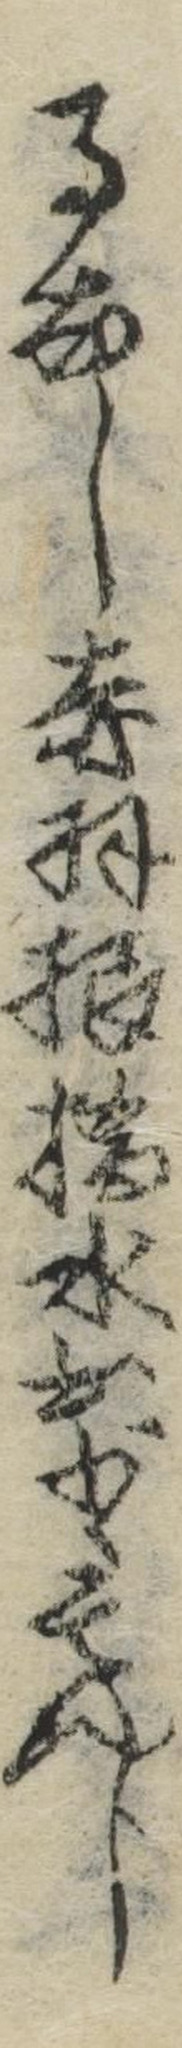事なし赤羽根橋水出少そんじ
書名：安政三年辰八月廿五日夜　大江都御屋敷方寺社市中共　大嵐水入場所明細書之寫　并街道筋近郷聞書
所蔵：東京大学地震研究所図書室 Earthquake Research Institute Library, The University of Tokyo, JAPAN
